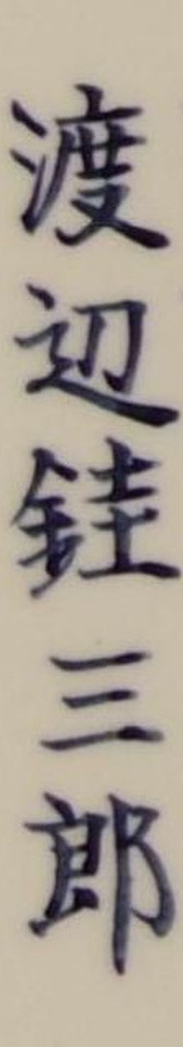渡辺銈三郎

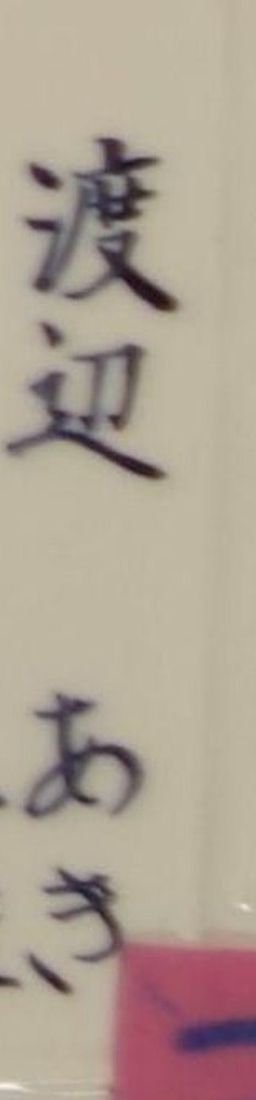渡辺あき
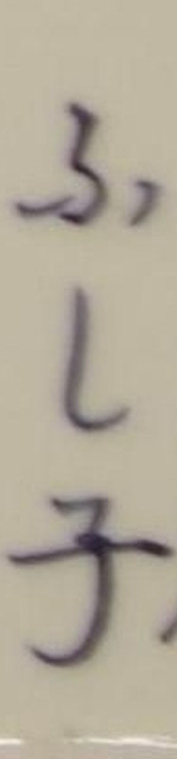ふし子
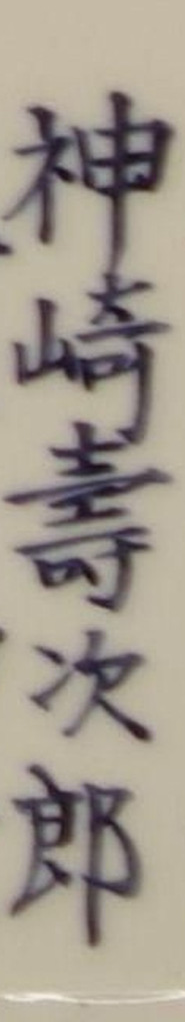神崎壽次郎
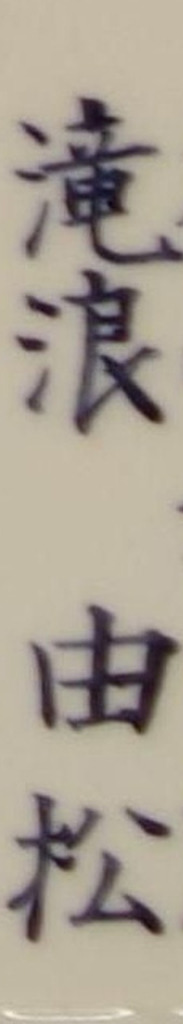滝浪由松
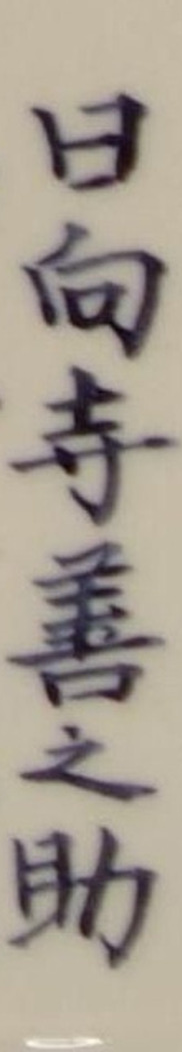日向寺善之助
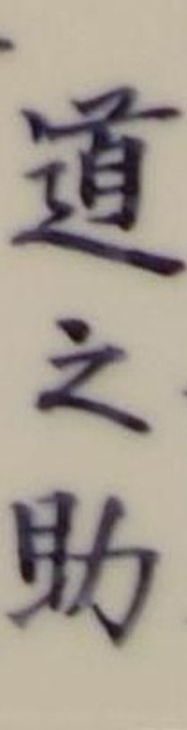道之助
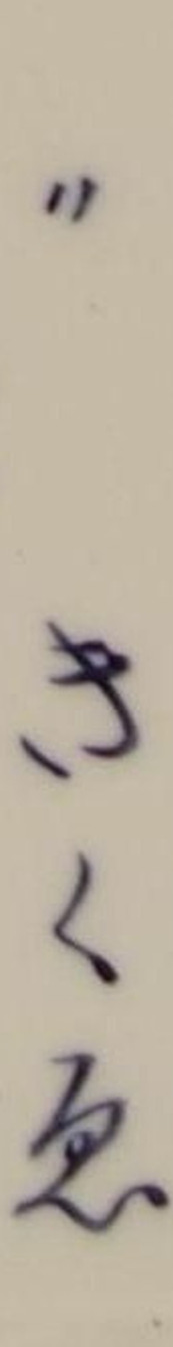きくえ
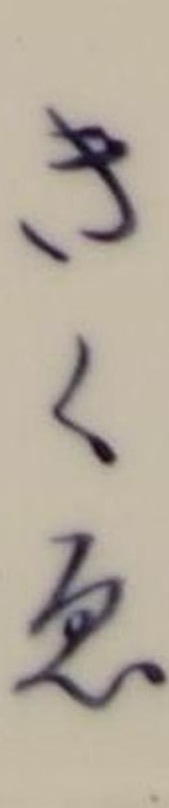きくえ
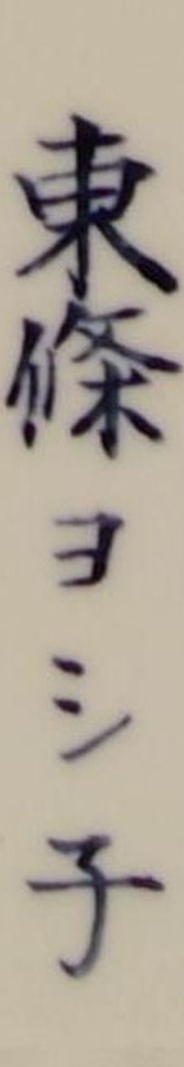東條ヨシ子
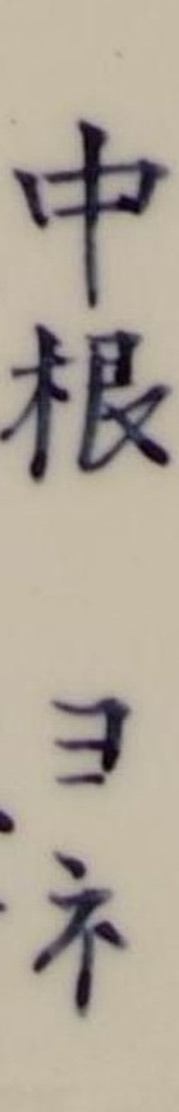中根ヨネ
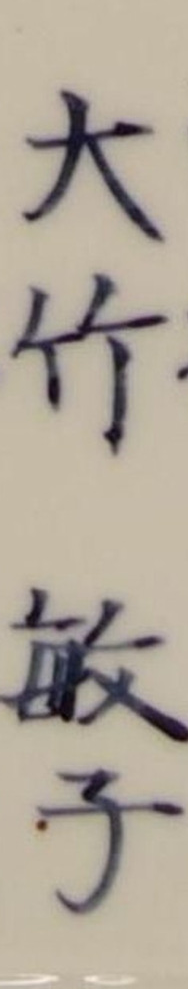大竹敏子
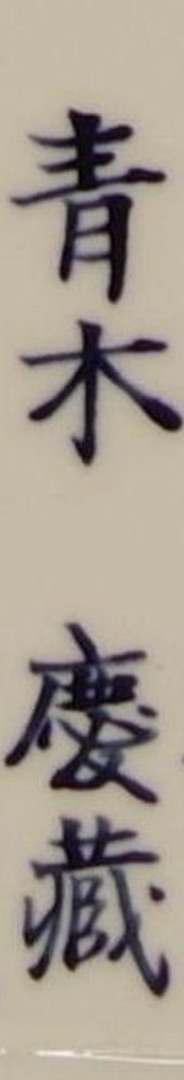青木慶蔵
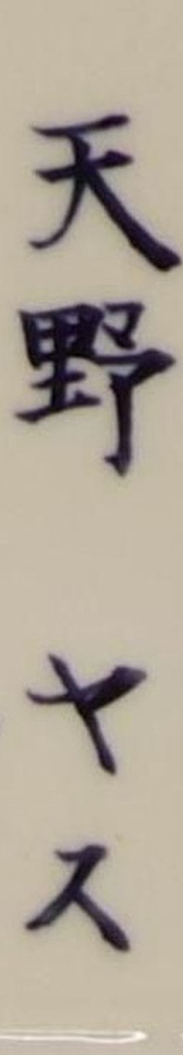天野ヤス
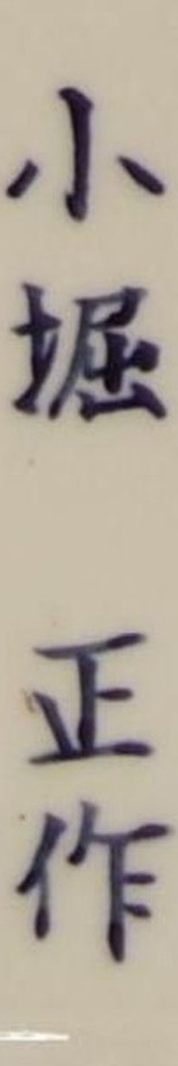小堀正作
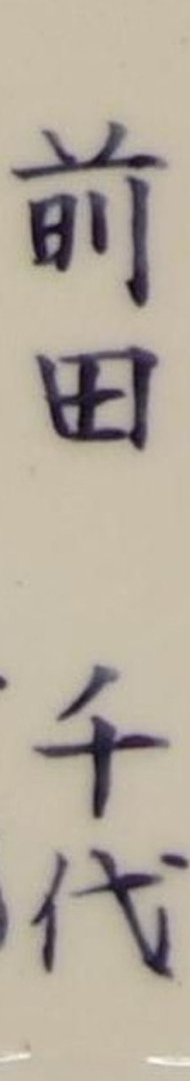前田千代
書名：M~S
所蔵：高野山金剛峯寺
